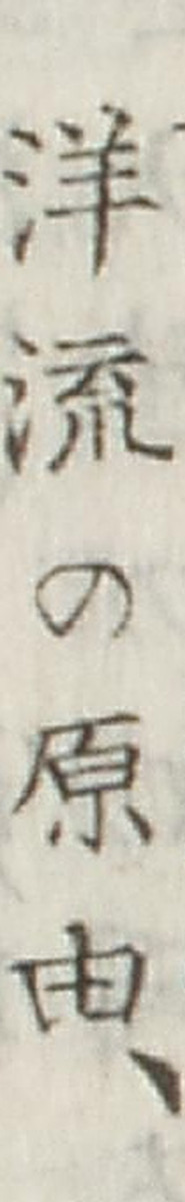洋水の原由、
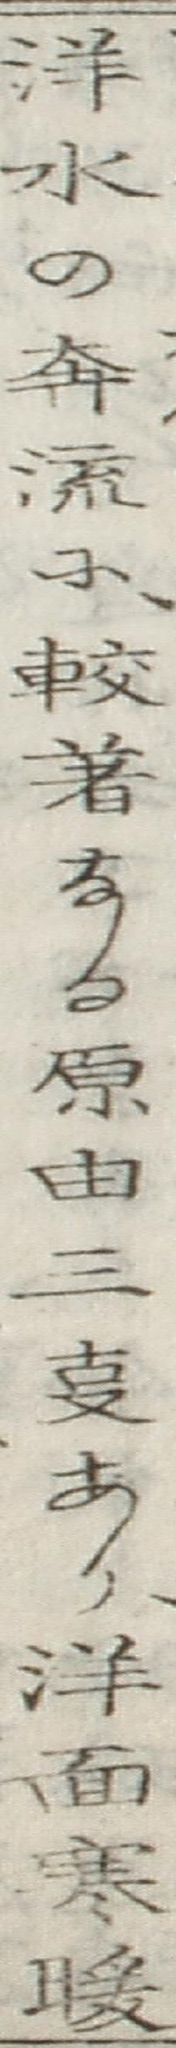洋水の奔流に、較著なる原由三事あり、洋面寒暖
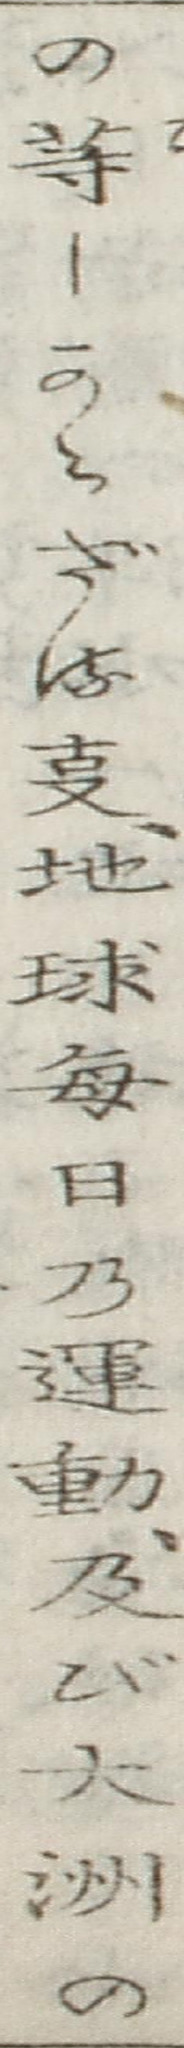の等しからざる事、地球毎日乃運動、及び大洲の
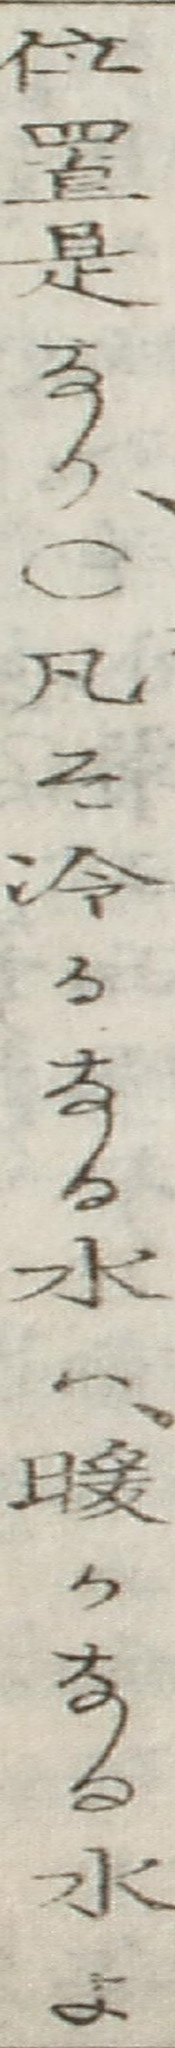位置是なり、○凡そ冷るなる水は、暖かなる水よ

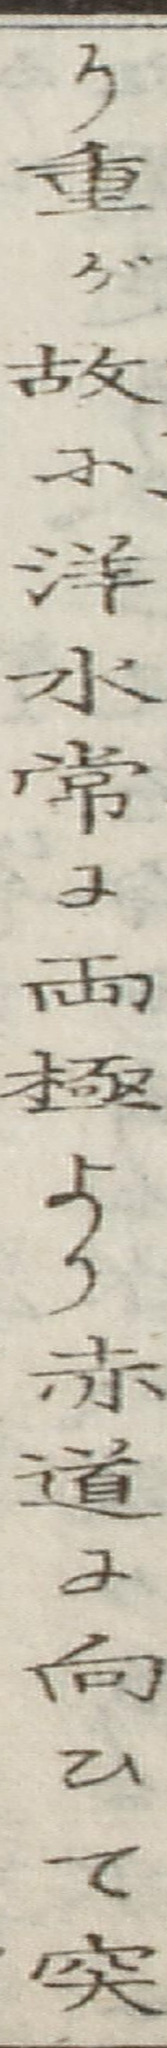り重が故に、洋水常に両極より赤道に向ひて突
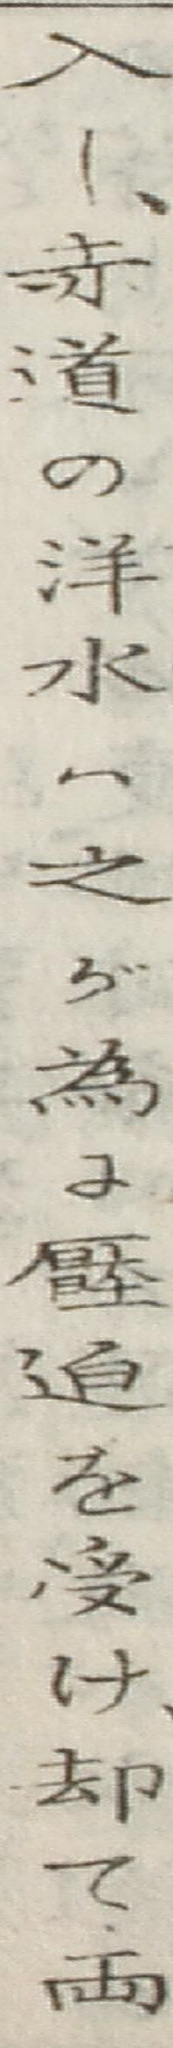入し、赤道の洋水は之が為に圧迫を受け、却て両
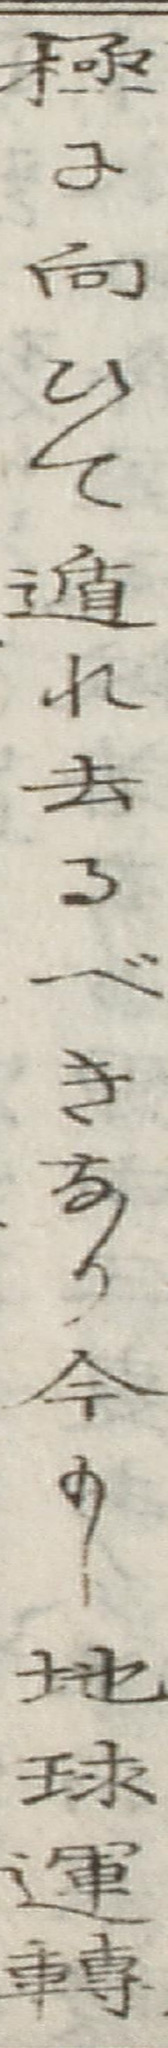極に向ひて遁れ去るべきなり、今もし地球運転
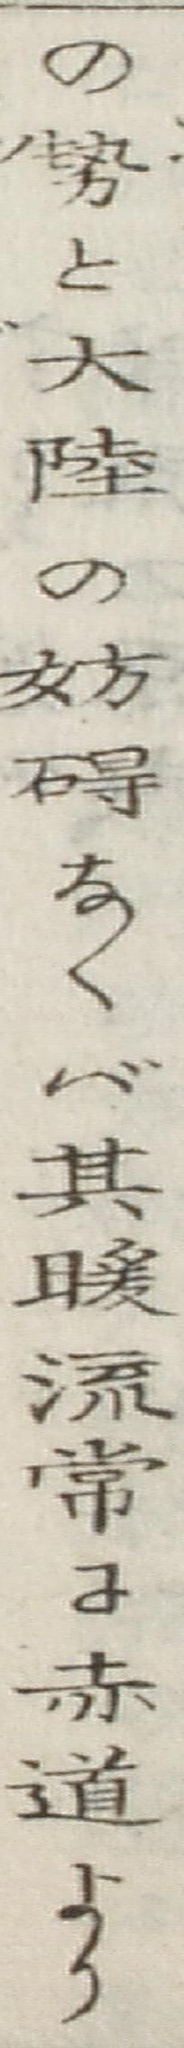の勢と大陸の妨碍なくば、其暖流常に赤道より
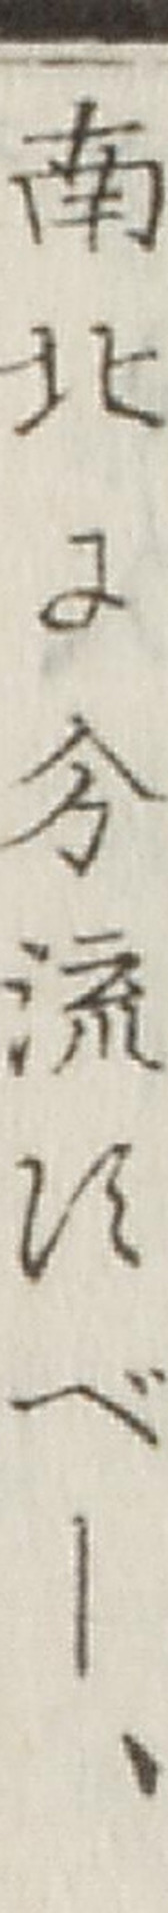南北に分流すべし、
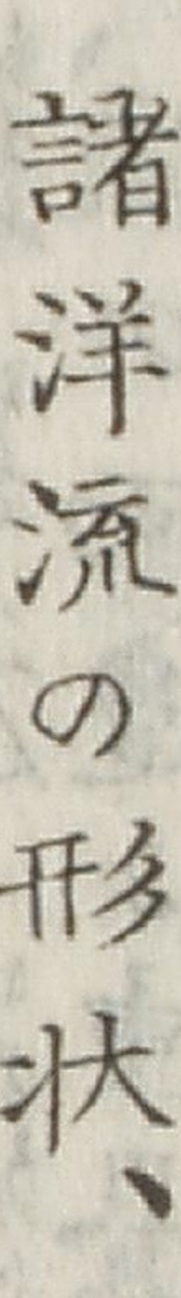諸洋流の形状、
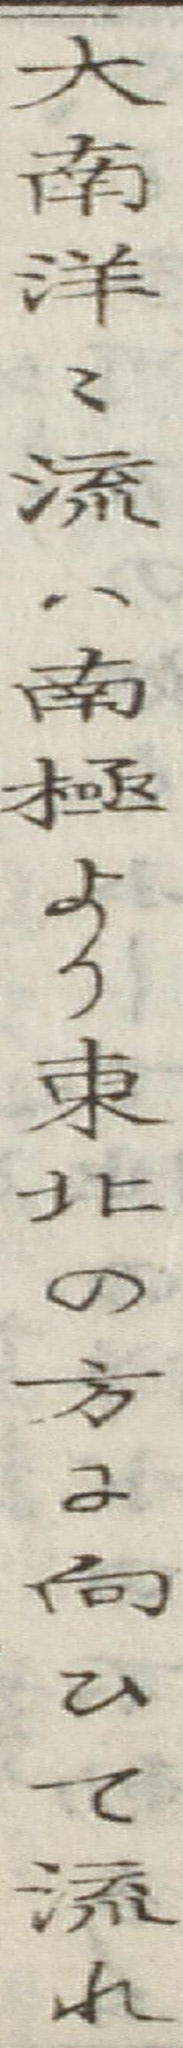大南洋〻流は南極より東北の方に向ひて流れ、
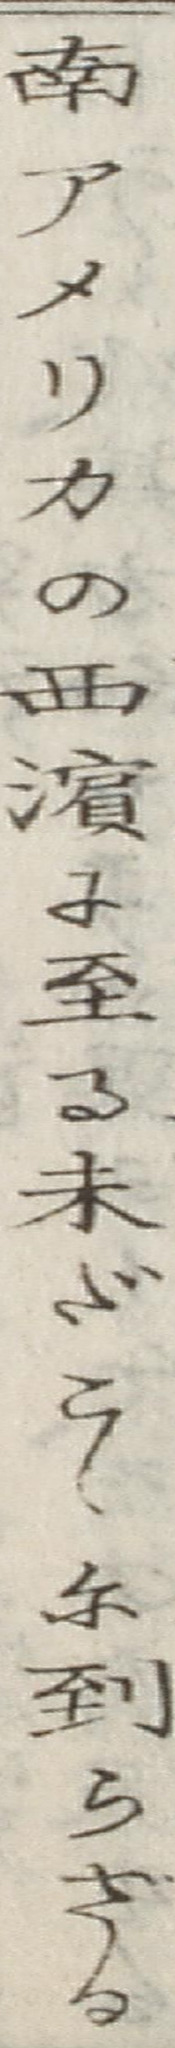南アメリカの西浜に至る、未だこゝに到らざる
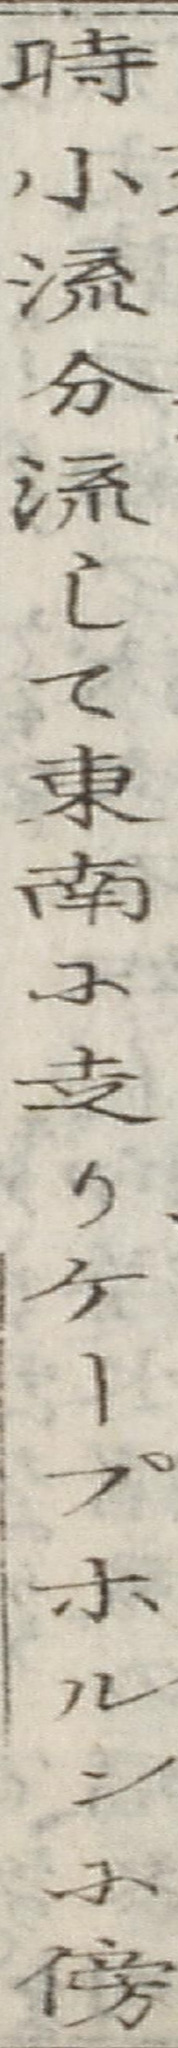時小流分流して東南に走り、ケープホルンに傍
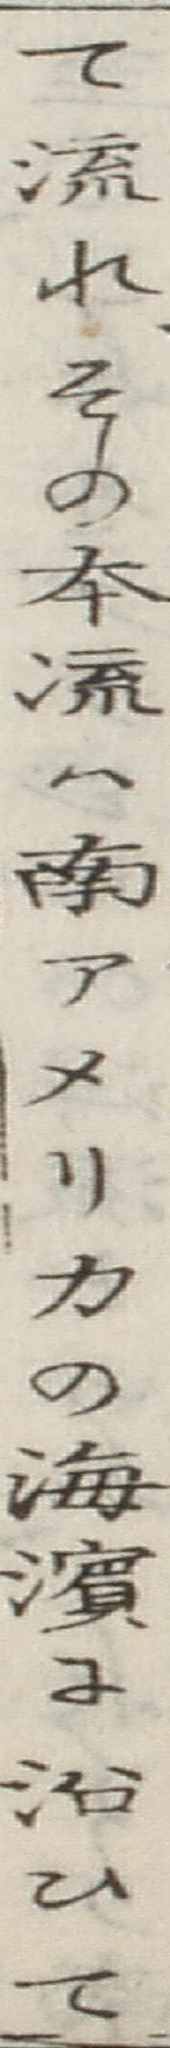て流れ、その本流は南アメリカの海浜に沿ひて
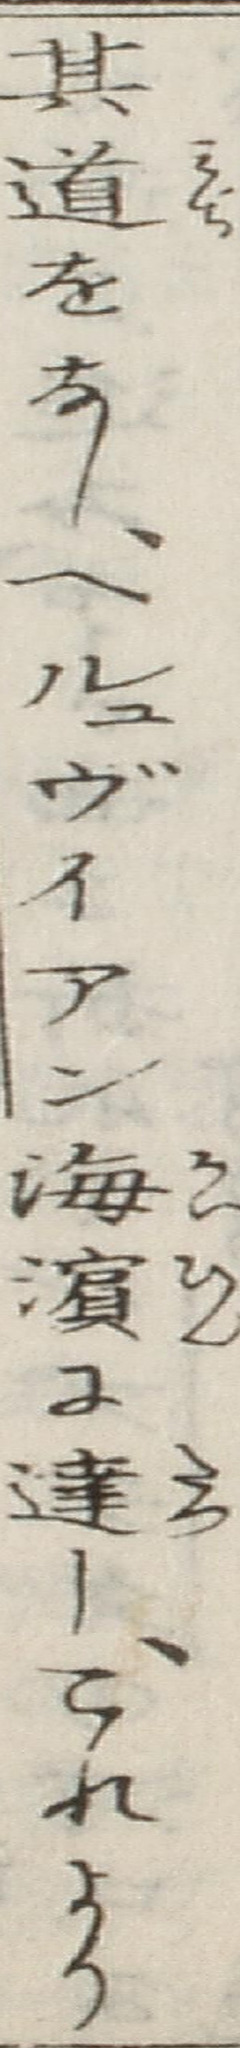其道をなし、ヘルュヴイアン海浜に達し、これより
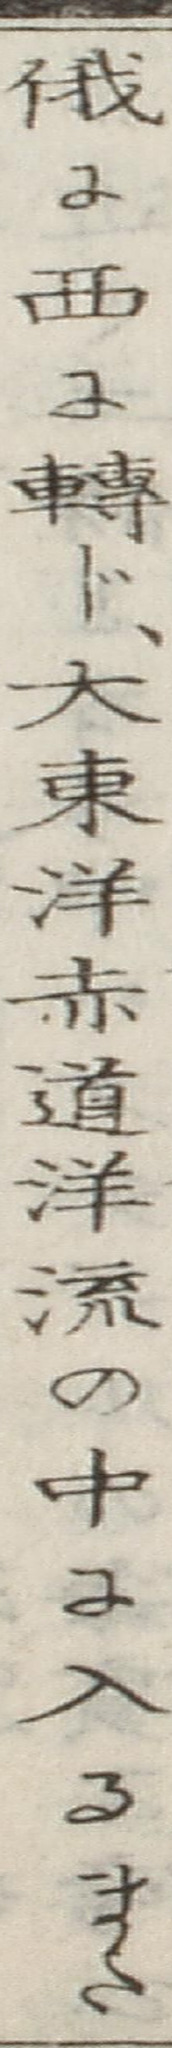俄に西に転じ、大東洋赤道洋流の中に入る、また
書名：訓蒙　天然地理學　中
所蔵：東京大学地震研究所図書室 Earthquake Research Institute Library, The University of Tokyo, JAPAN
